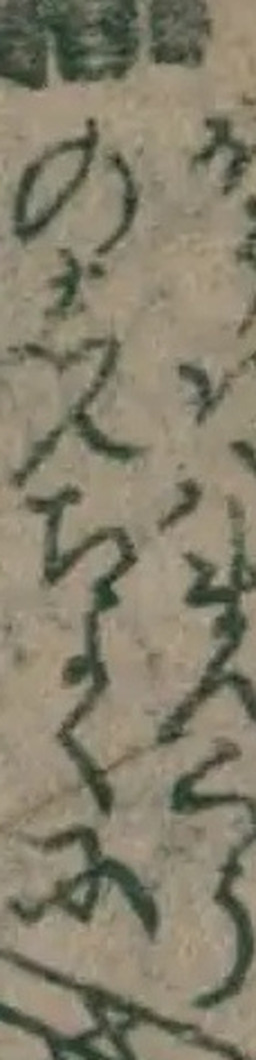のしんちよくに
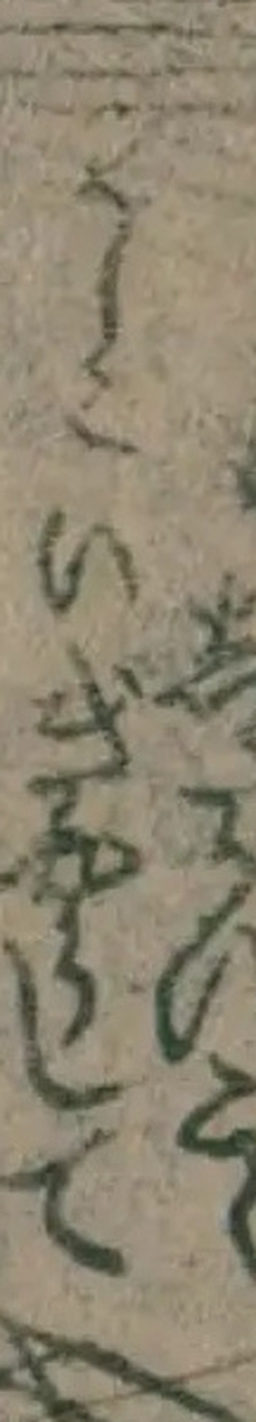かしこいぎゃうして
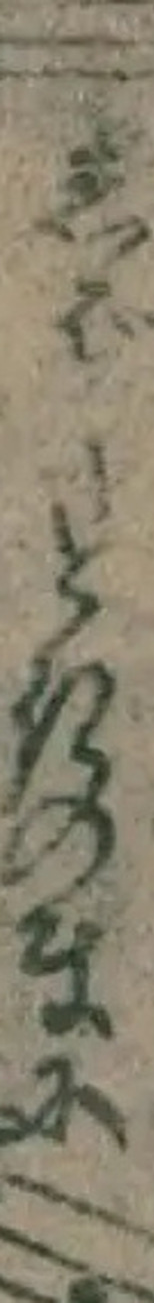しばときのまに
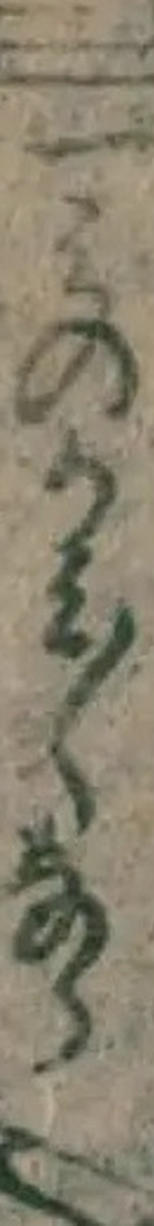一みのかみ〳〵なら
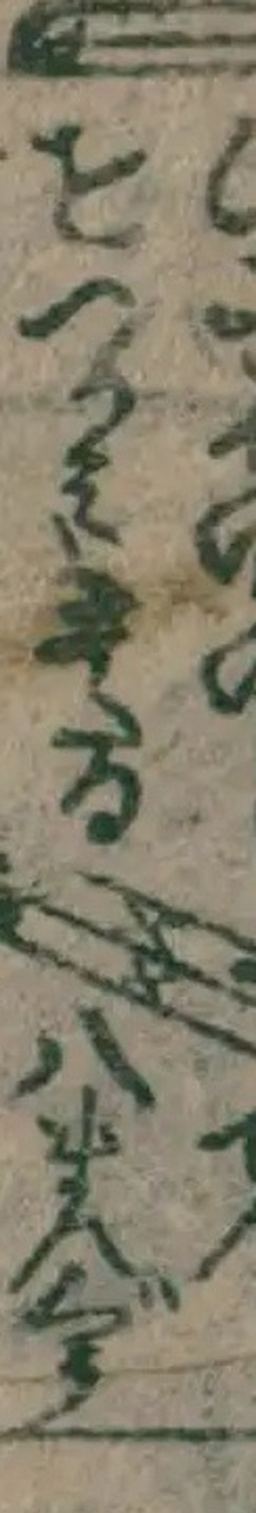をつかみきたる八まんぐう
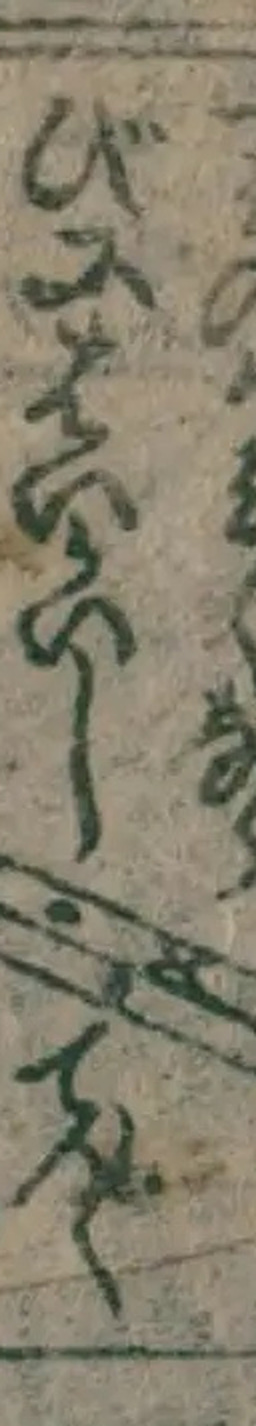びにはいかいしてん〳〵
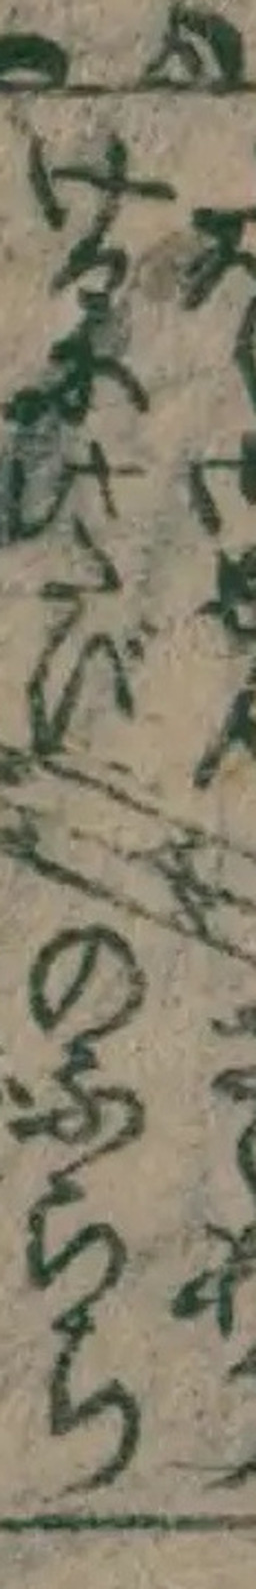けるに此たびのふらち
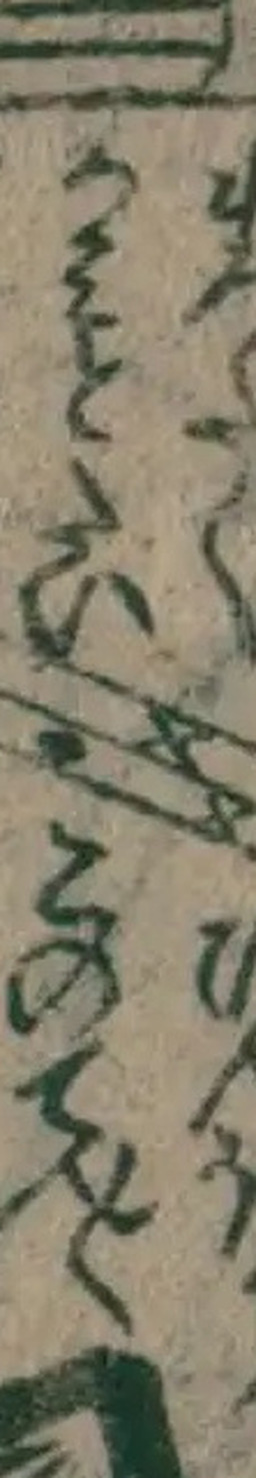かみとたいこのてん〳〵
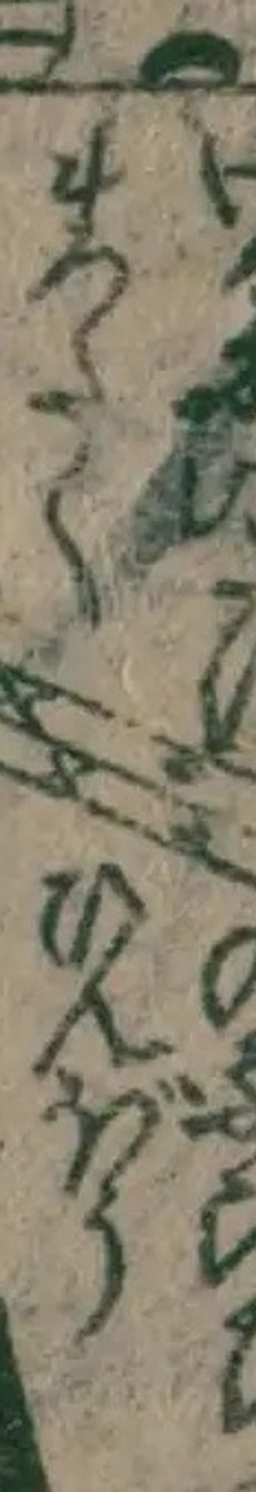まつたくひんぼう
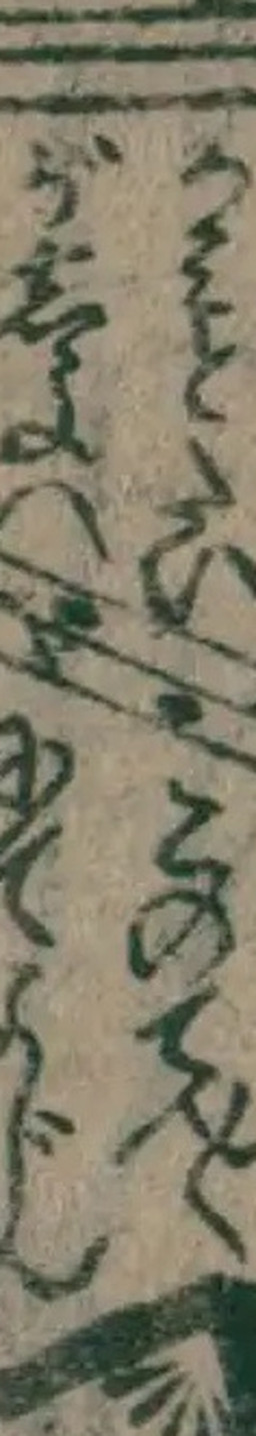がしよいにてよじん
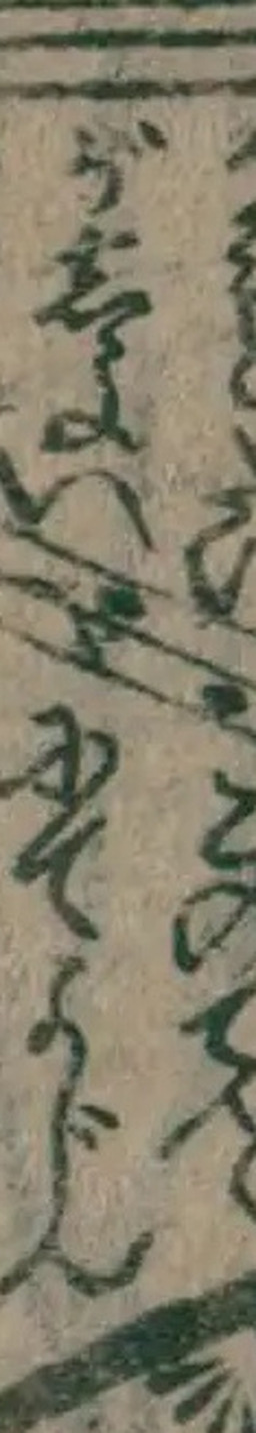がしよいにてよじん
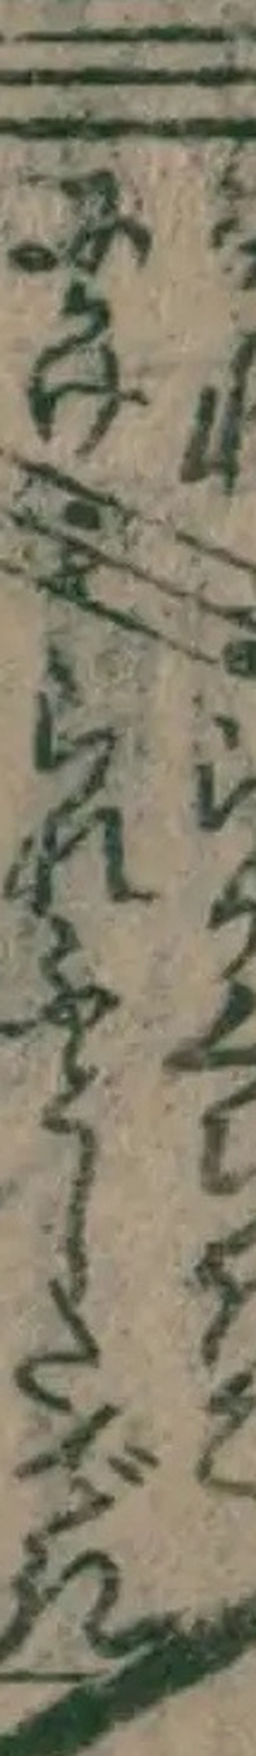にかけられふとしたでき
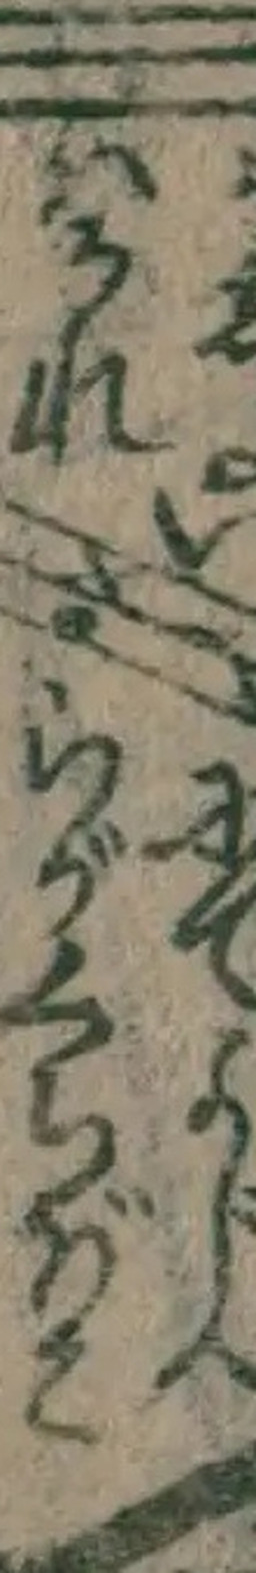はかれらがくちぼこ
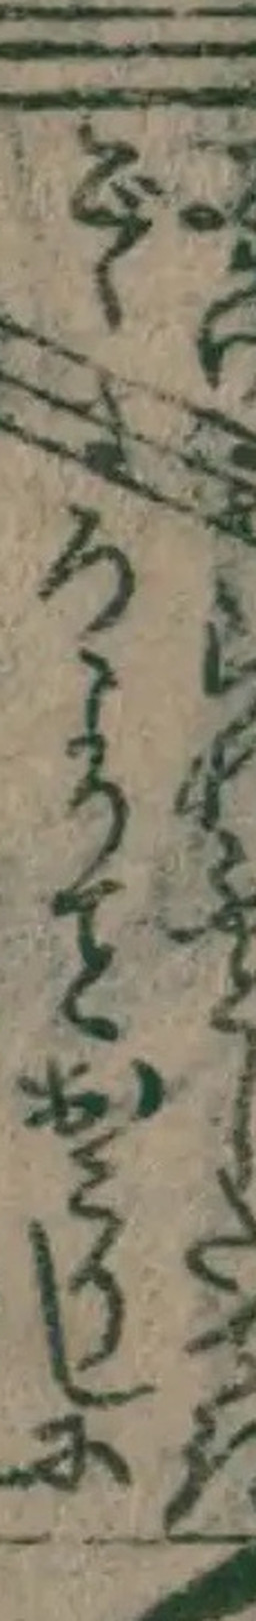ごゝろよりことおこりしに
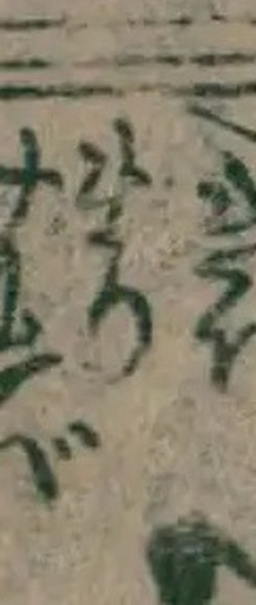ければ
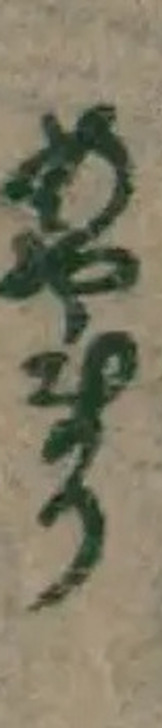あやまり
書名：頓作時雨月 3巻
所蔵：国立国会図書館 National Diet Library, JAPAN
